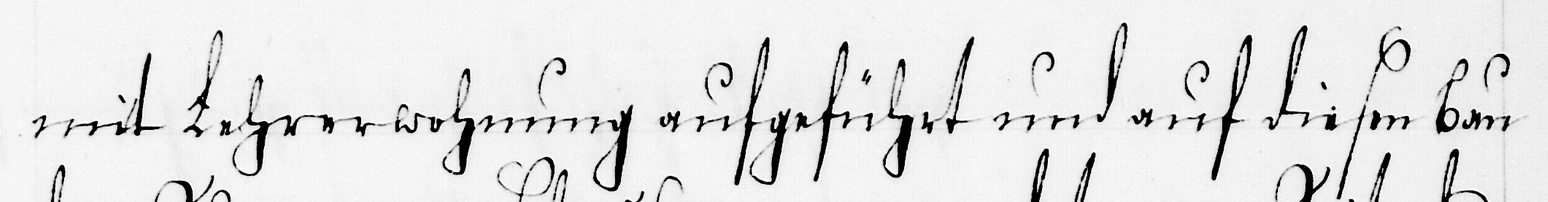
mit Lehrerwohnung aufgeführt und auf diesen Bau
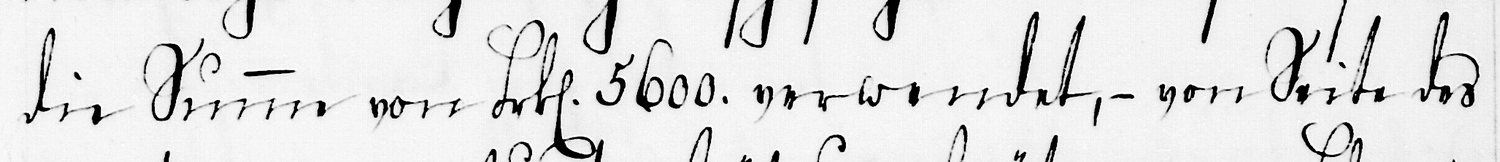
die Summe von Frk[en]. 5600. verwendet, – von Seite des
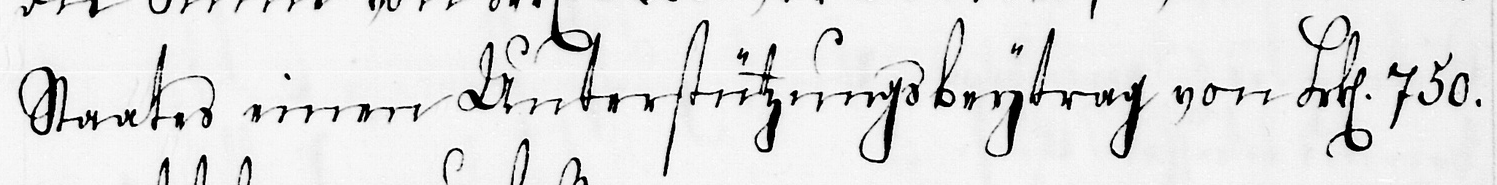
Staates einen Unterstützungsbeytrag von Frk[en]. 750.
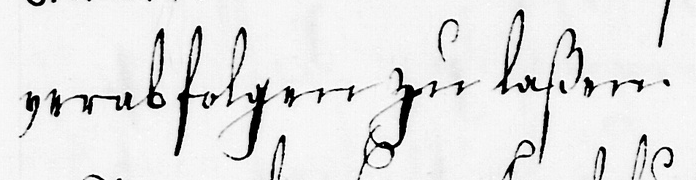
verabfolgen zu laßen.
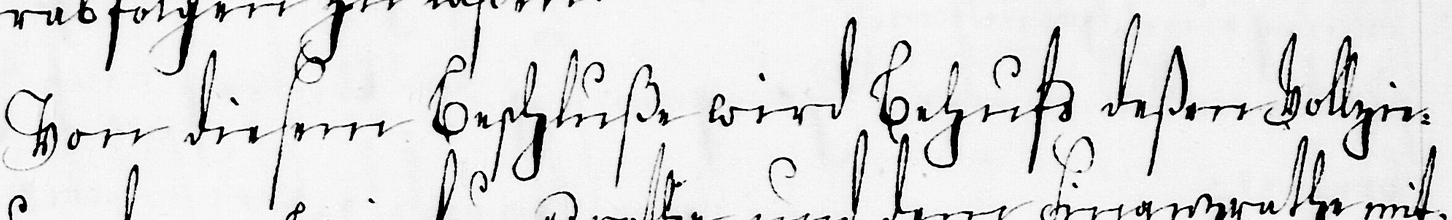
Von diesem Beschluße wird Behufs deßen Vollzie¬
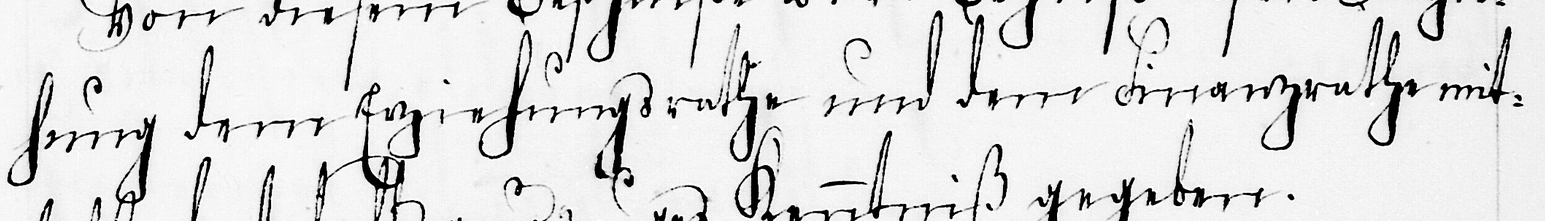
hung dem Erziehungsrathe und dem Finanzrathe mit¬
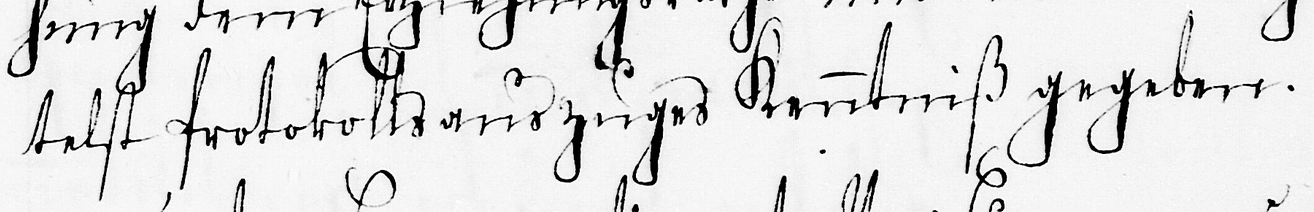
telst Protokollsauszuges Kenntniß gegeben.
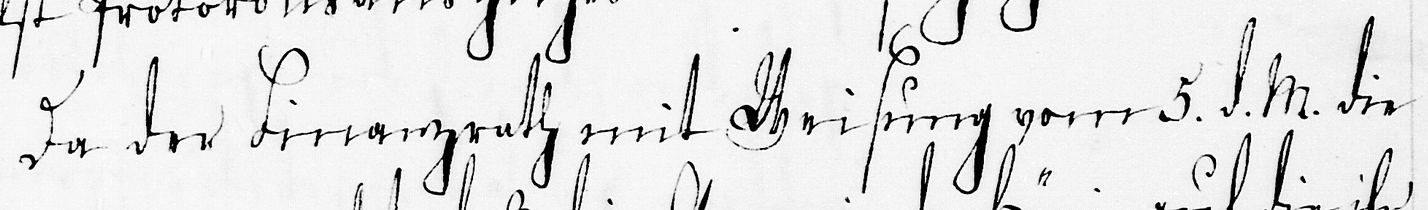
Da der Finanzrath mit Weisung vom 5. d. M. die
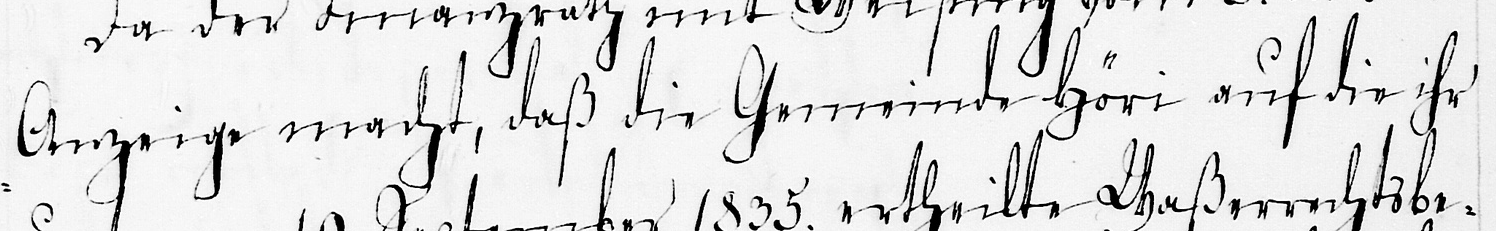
Anzeige macht, daß die Gemeinde Höri auf die ihr
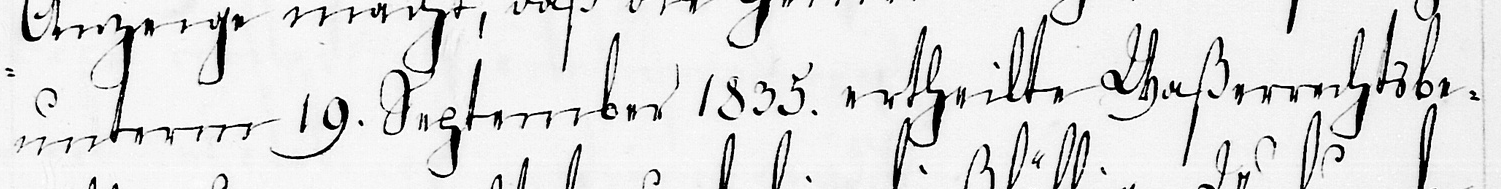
unterm 19. September 1835. ertheilte Waßerrechtsbe¬
